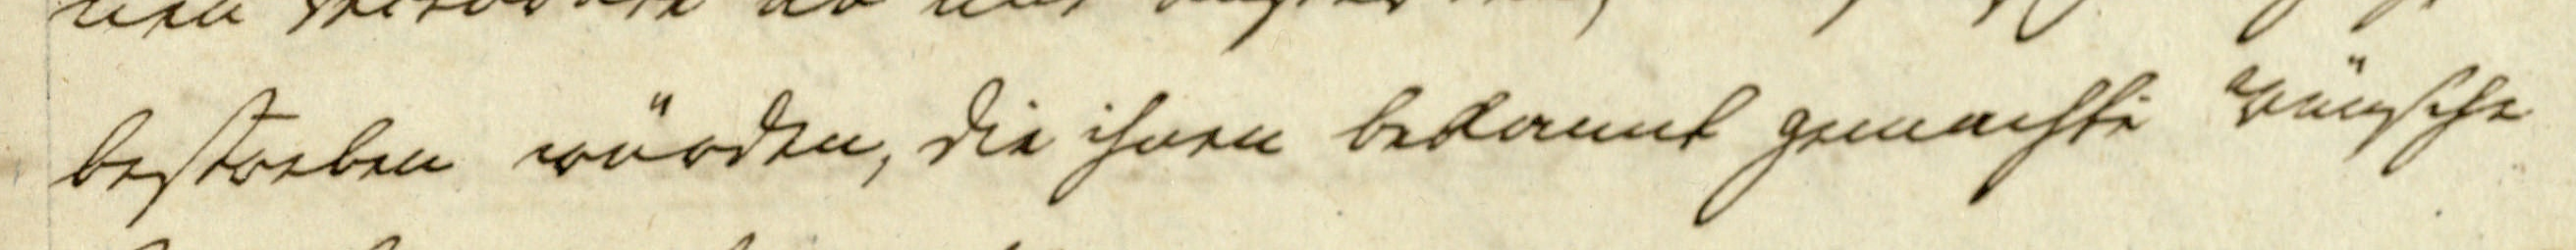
bestreben würden, die ihnen bekannt gemachte Wünsche
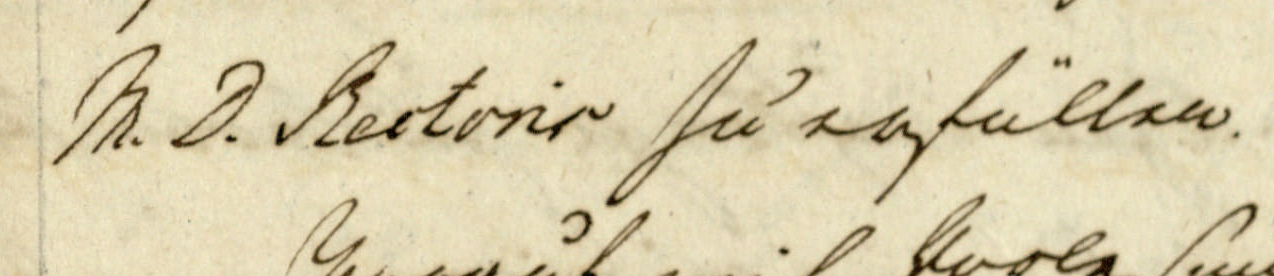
M. D. Rectoris zu erfüllen.
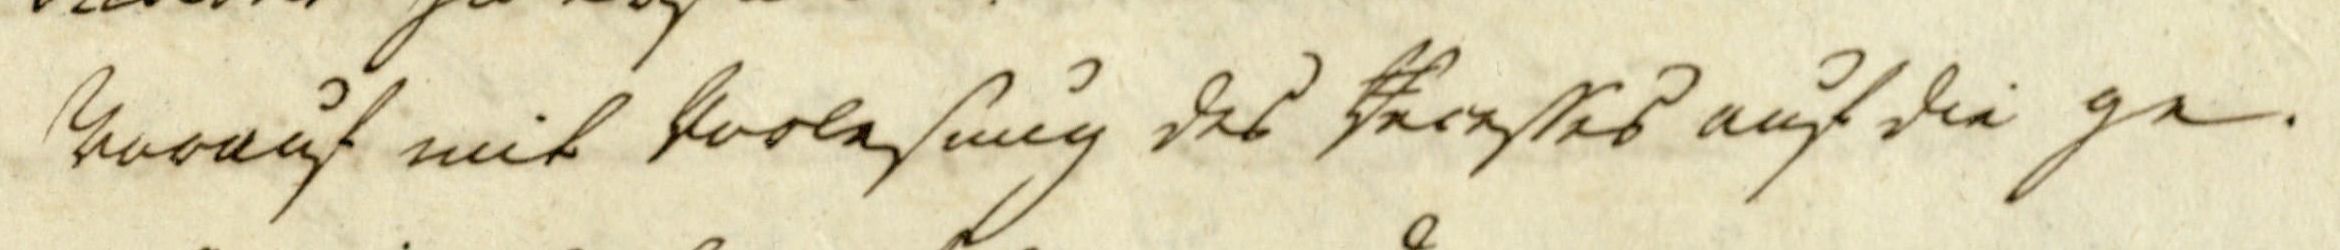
Worauf mit Verlesung des Recesses auf die ge¬
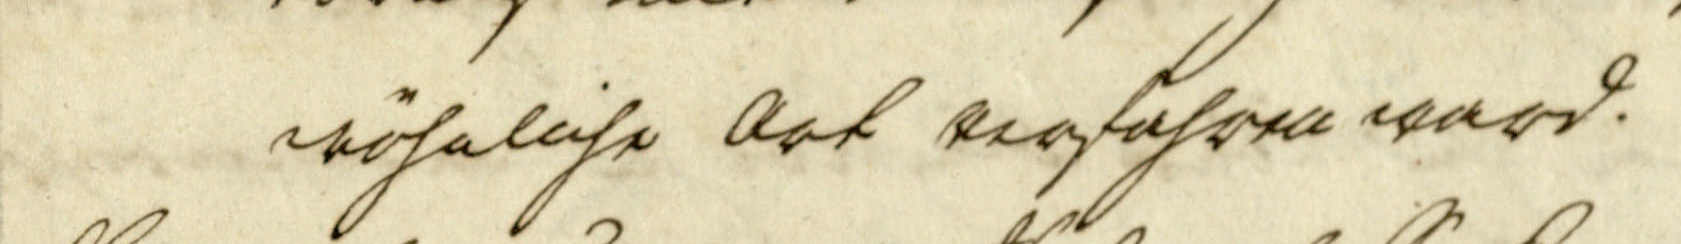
wöhnliche Art verfahren ward.
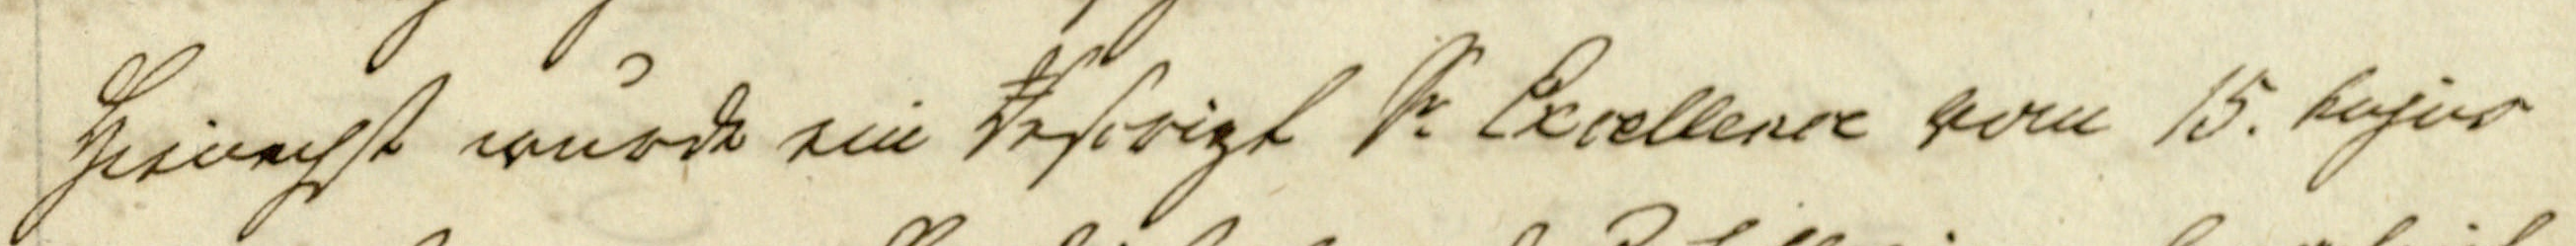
Hienechst wurde ein Rescript Sr. Excellence vom 15. hujus
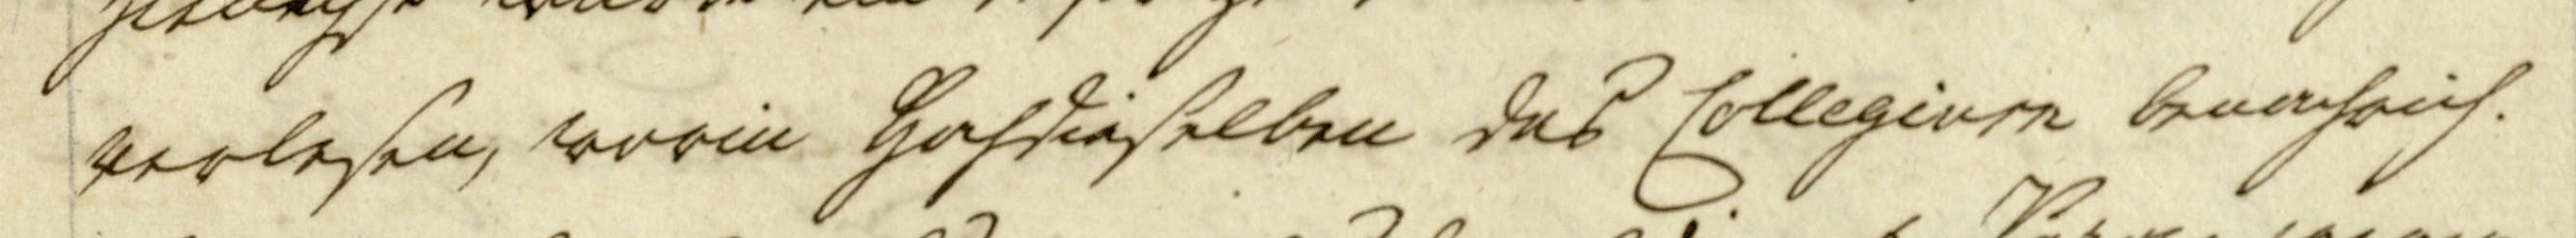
verlesen, worin Hochdieselben das Collegium benachrich¬
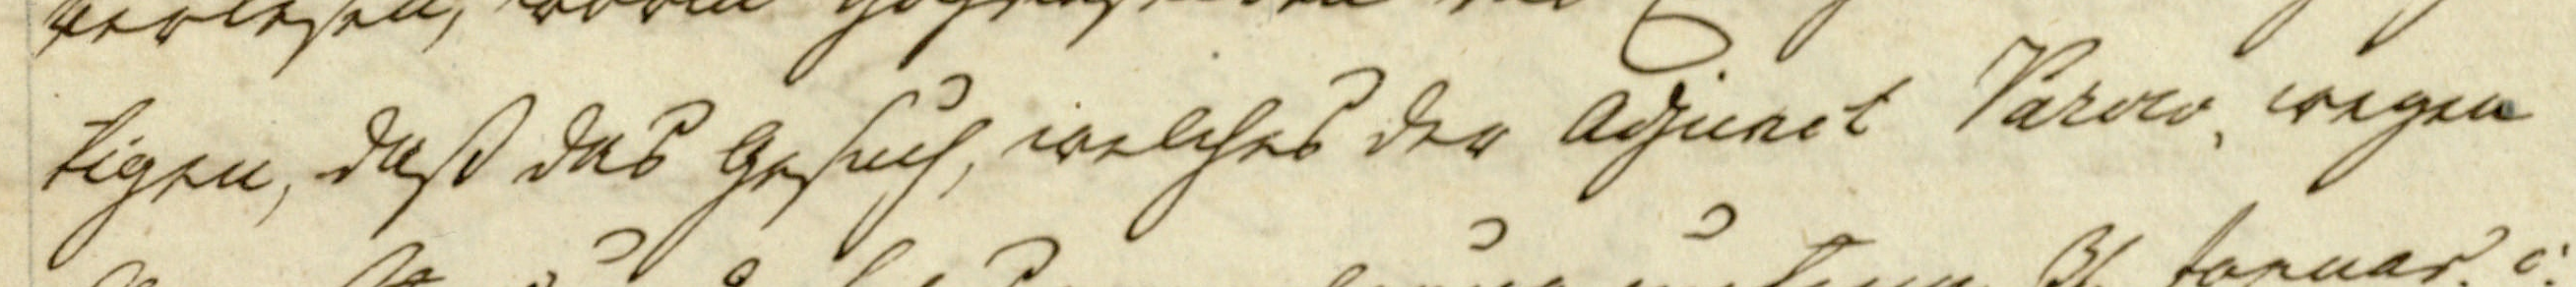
tigen, daß das Gesuch, welches der Adjunct Parow wegen
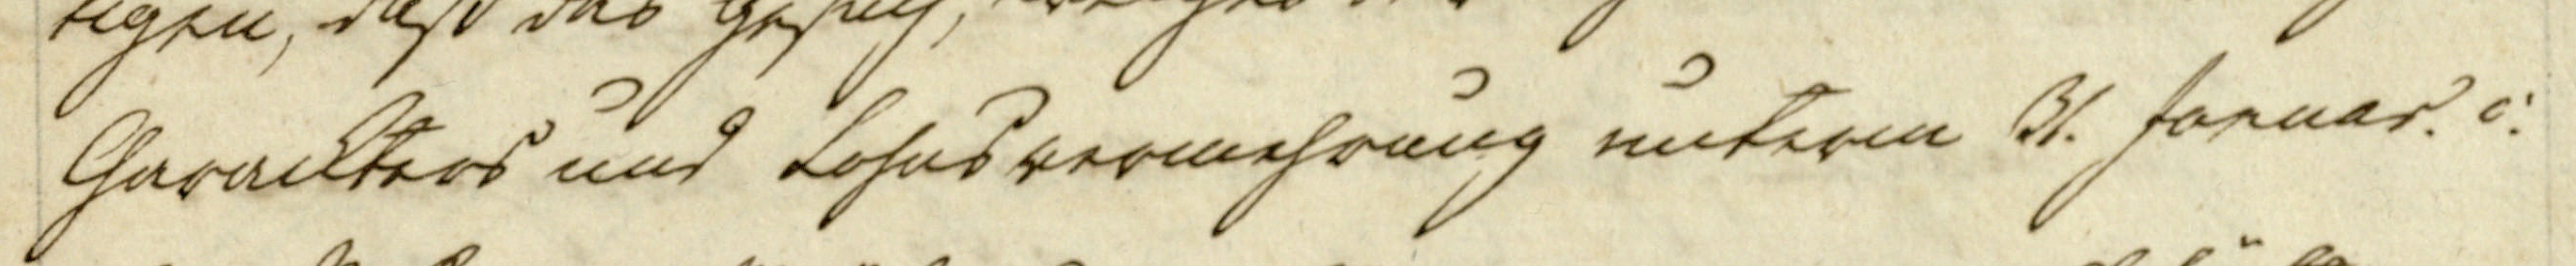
Charackters und Lohnsvermehrung unterm 31. Januar. c.
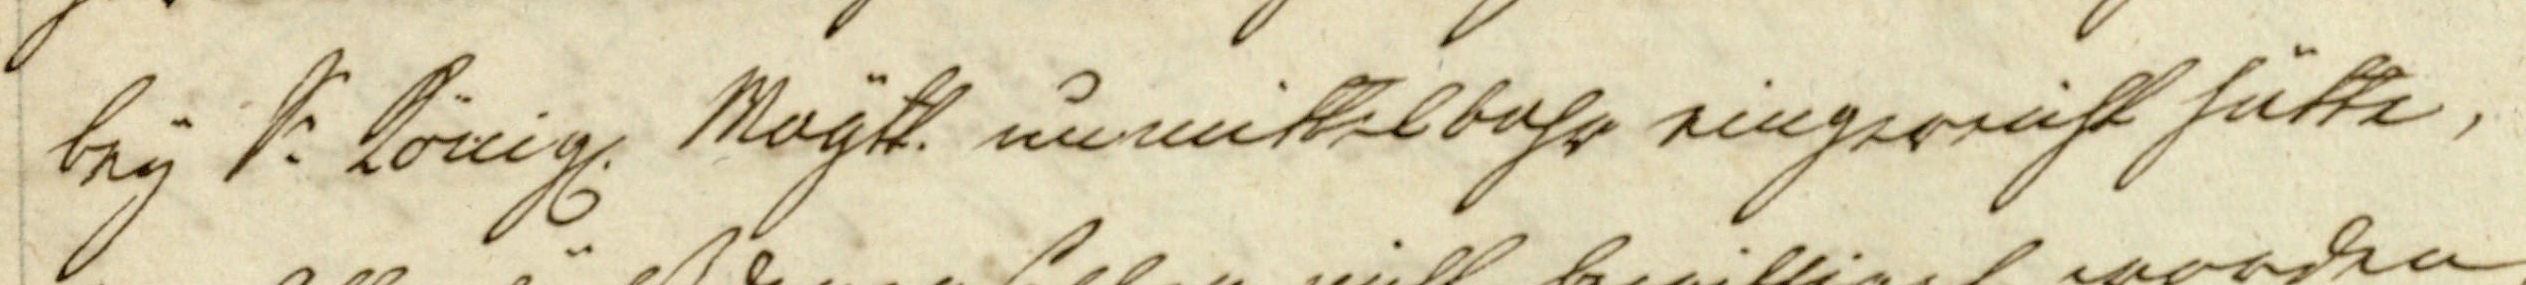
beÿ Sr. Königl. Maÿtt. unmittelbahr eingereicht hätte,
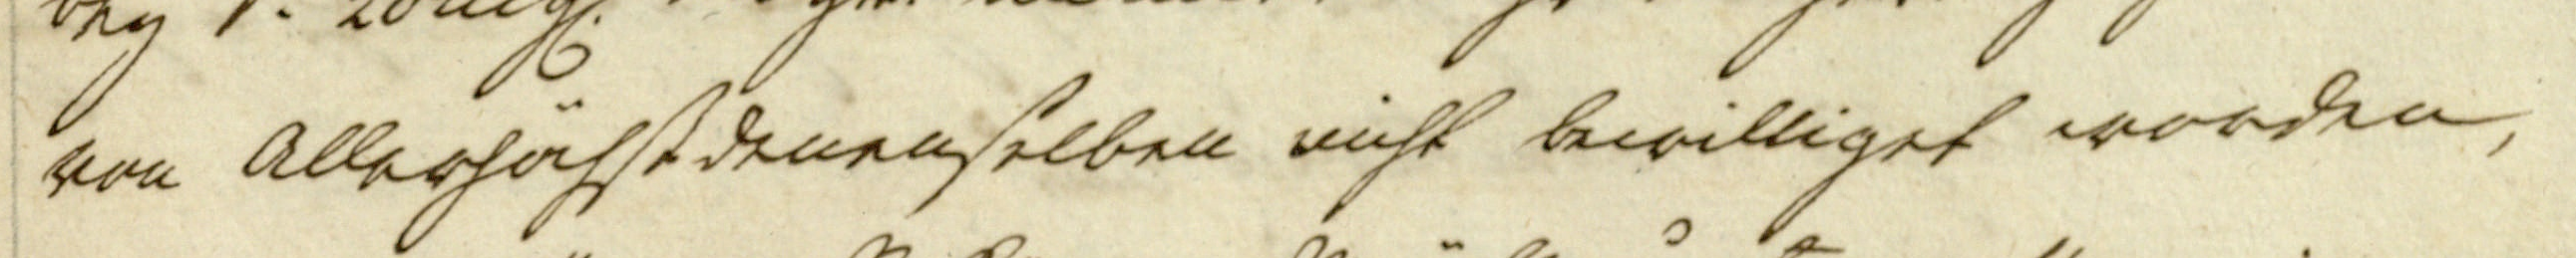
von allerhöchst denenselben nicht bewilliget worden,
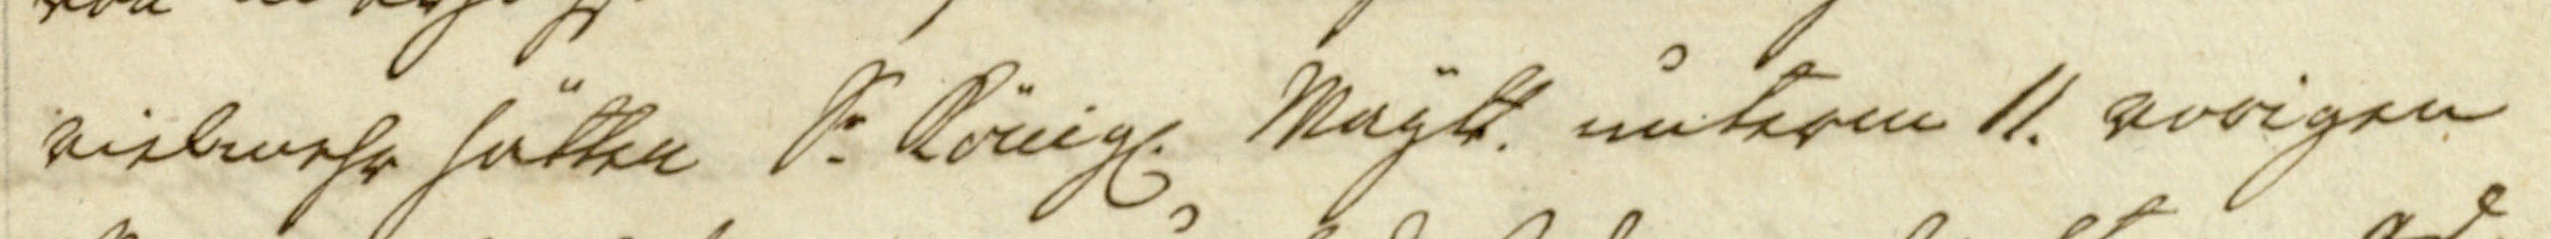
vielmehr hätten Sr. Königl. Maÿtt. unterm 11. vorigen
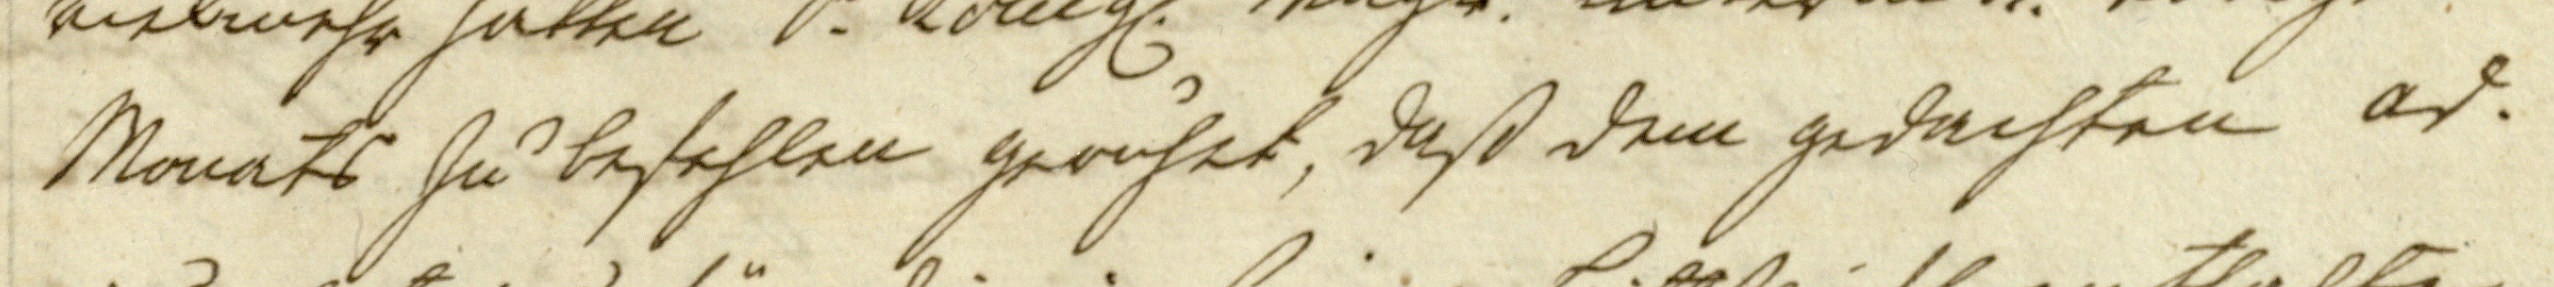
Monats zu befehlen geruhet, daß dem gedachten ad¬
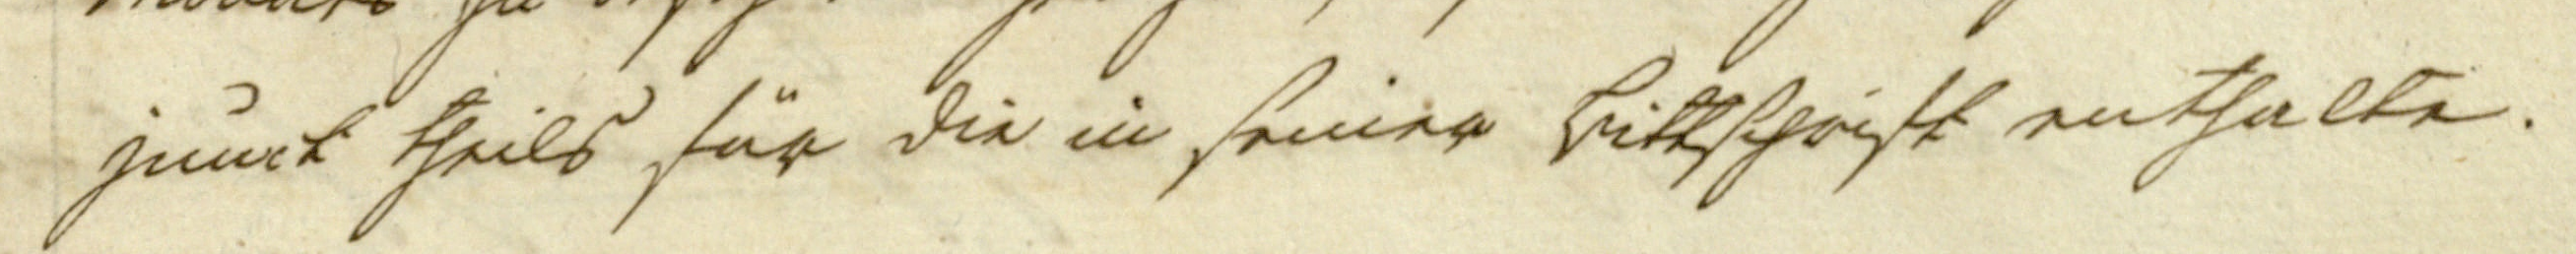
junct theils für die in seiner Bittschrift enthalte¬
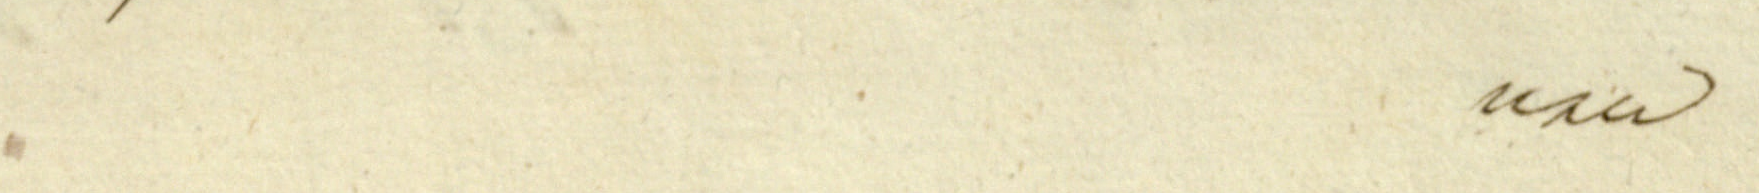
nen
